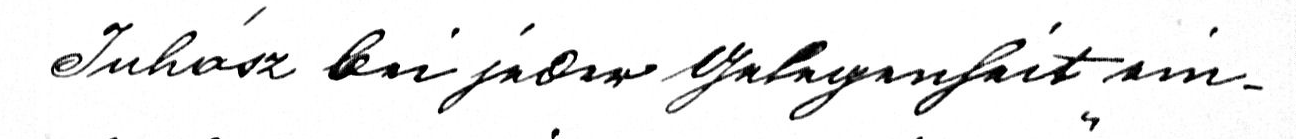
Inhász bei jeder Gelegenheit ein¬
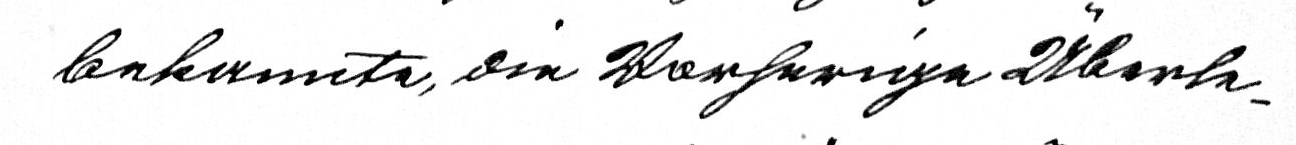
bekannte, die Vorherige Überle¬
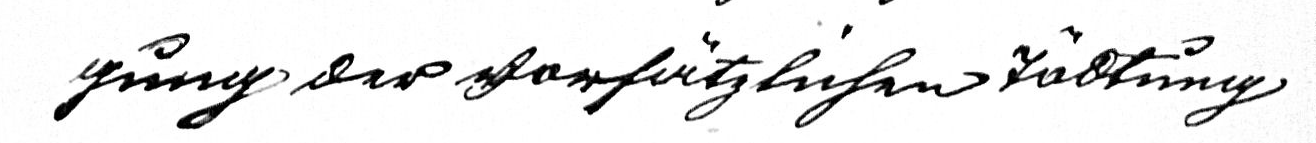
gung der vorsätzlichen Tödtung
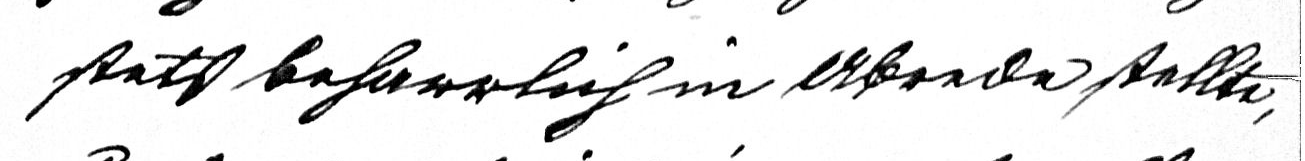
stets beharrlich in Abrede stellte,
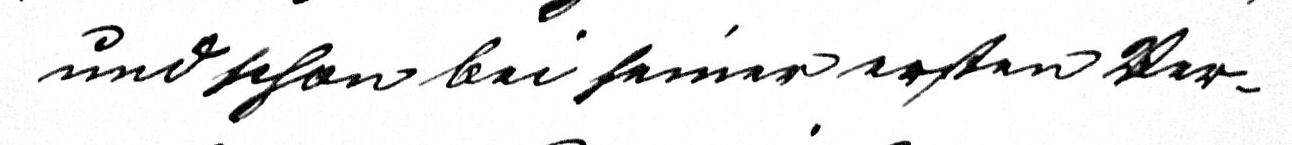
und schon bei seiner ersten Ver¬
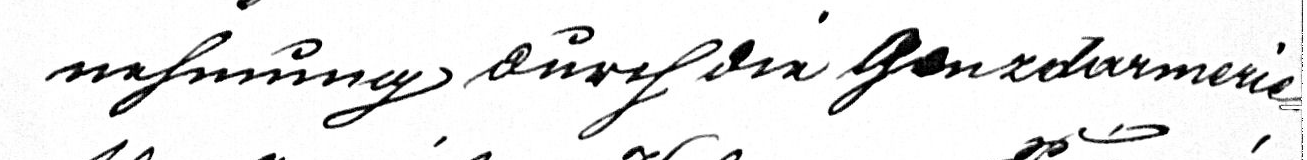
nehmung durch die Genzdarmerie
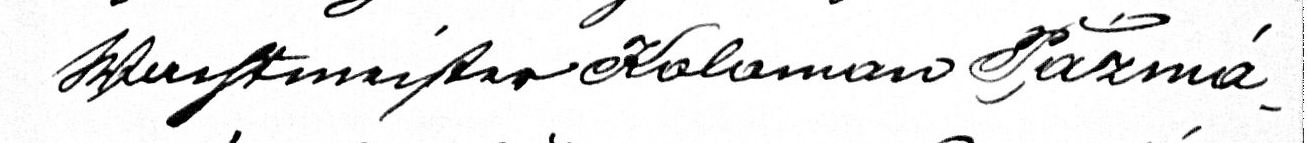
Wachtmeister Koloman Pazmá¬
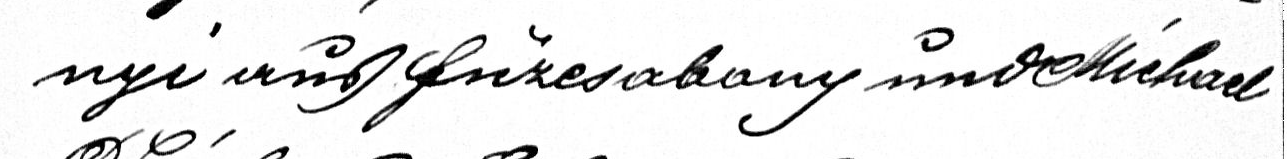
nyi aus Füzesabony und Michael
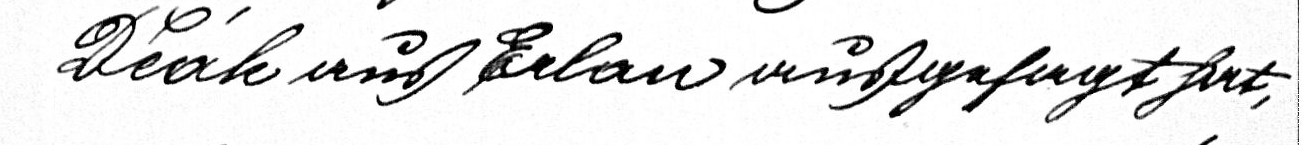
Deák aus Erlan ausgesagt hat,
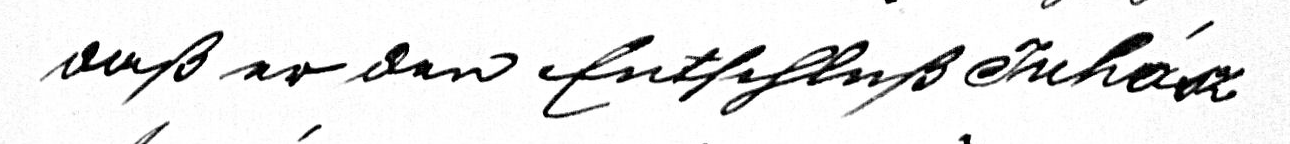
daß er den Entschleß Inhász
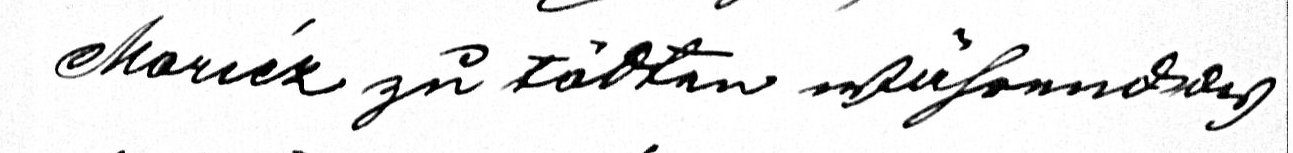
Morcéz zu tödten währendedes
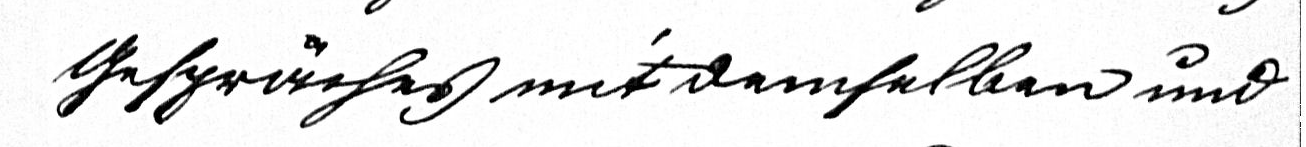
Gespräches mit demselben und
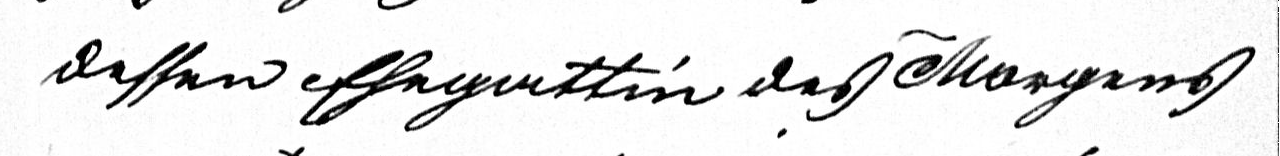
dessen Ehegattin des Morgens
